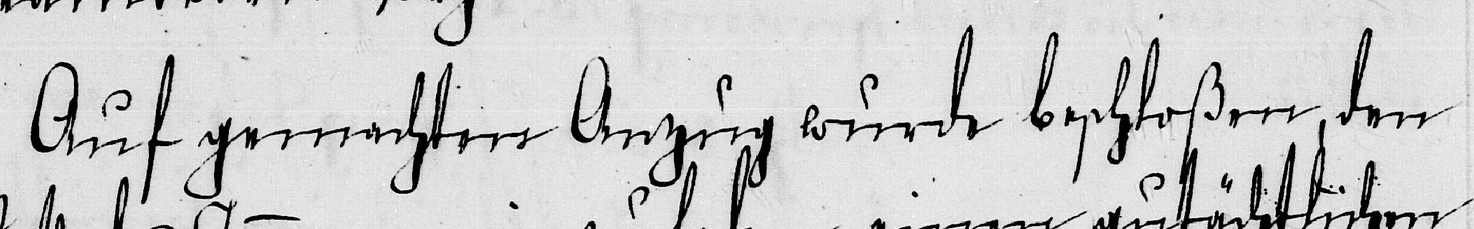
Auf gemachten Anzug wurde beschloßen, den
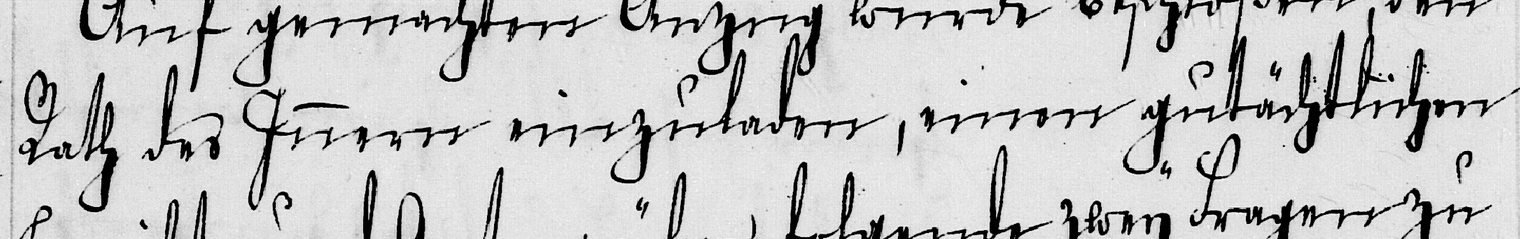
Rath des Innern einzuladen, einen gutächtlichen
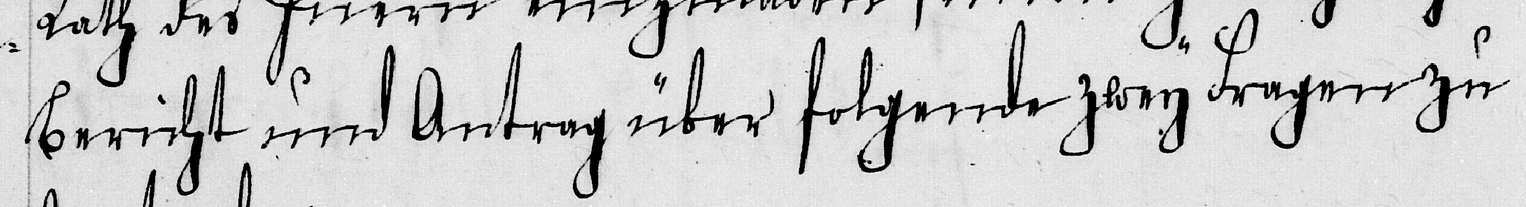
Bericht und Antrag über folgende zwey Fragen zu
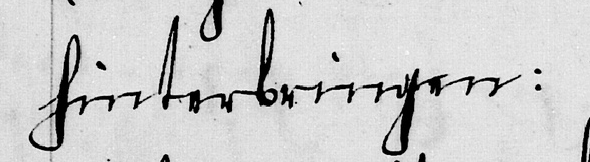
hinterbringen:
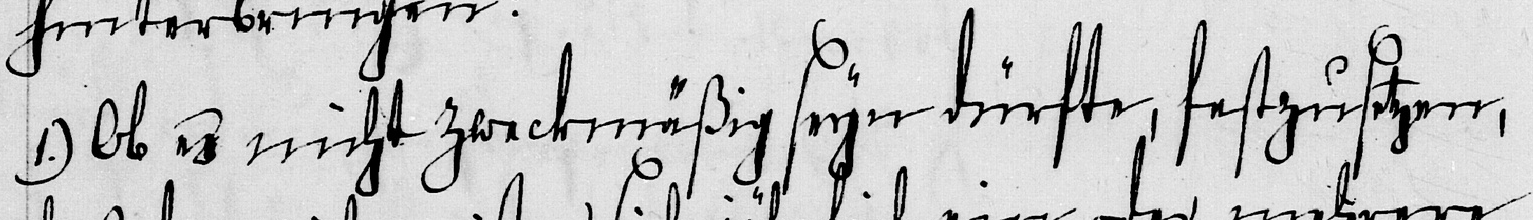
1.) Ob es nicht zweckmäßig seyn dürfte, festzusetzen,
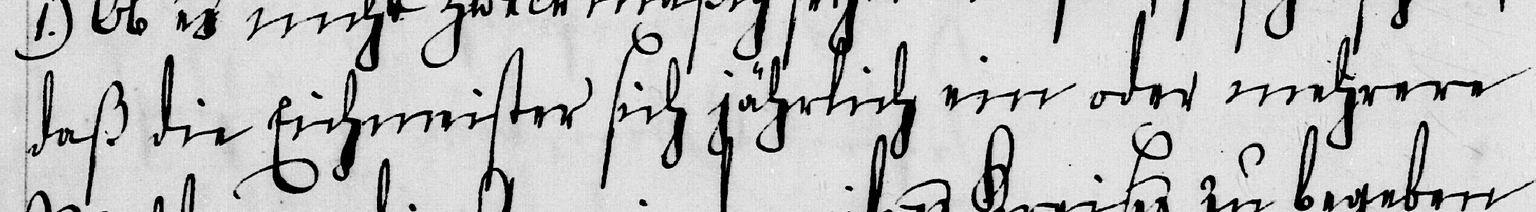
daß die Eichmeister sich jährlich ein oder mehrere
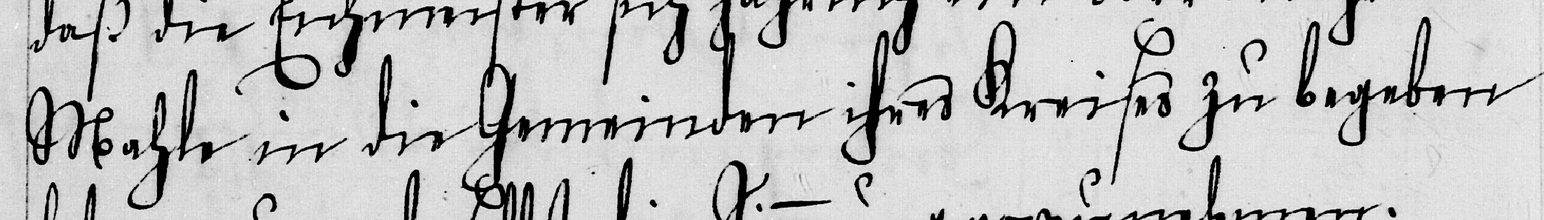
Mahle in die Gemeinden ihres Kreises zu begeben
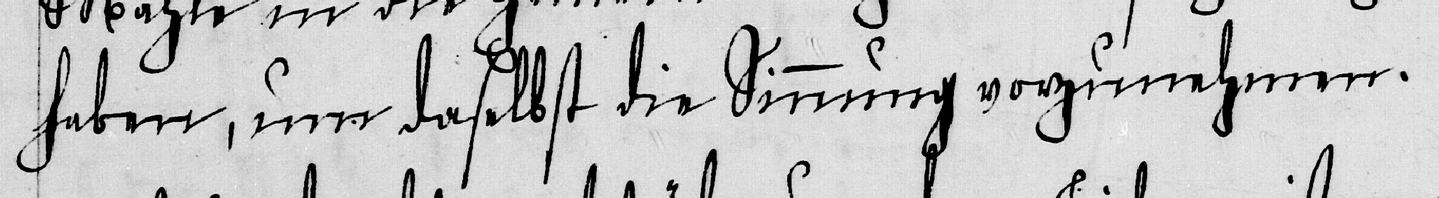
haben, um daselbst die Sinnung vorzunehmen.
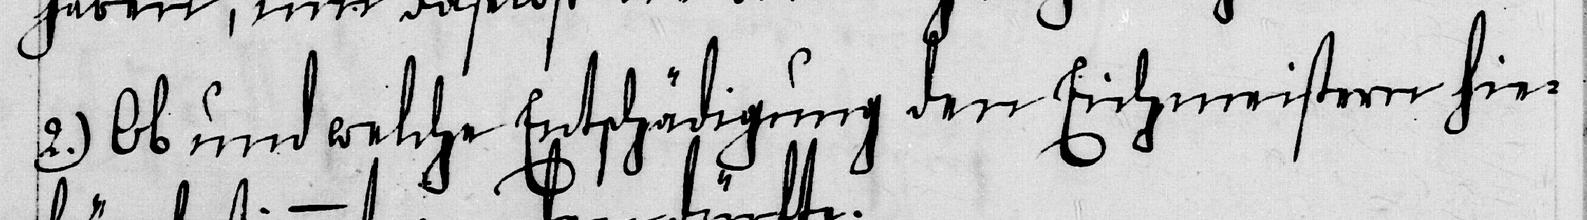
2.) Ob und welche Entschädigung den Eichmeistern hie¬
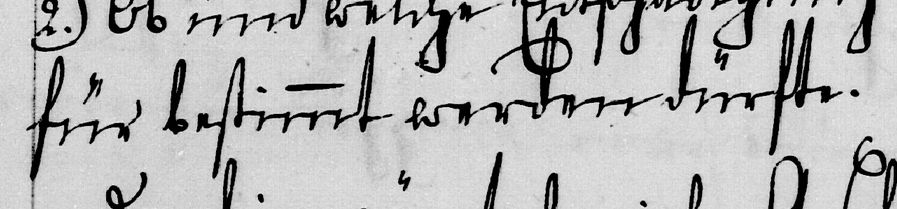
für bestimmt werden dürfte.
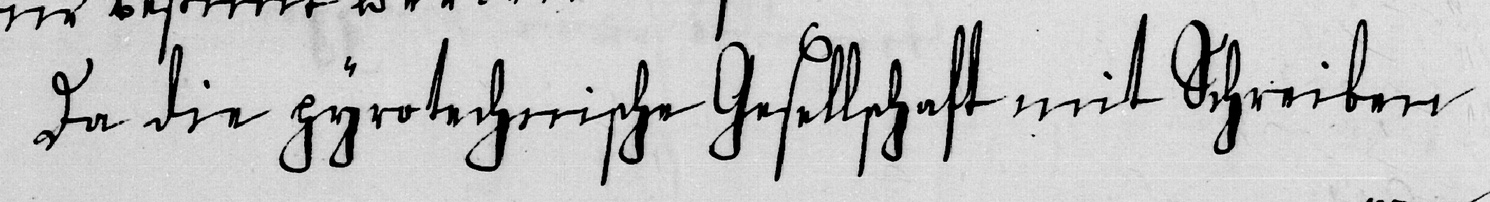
Da die pyrotechnische Gesellschaft mit Schreiben
